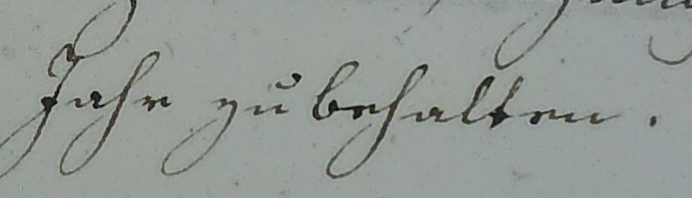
Jahr zu behalten.
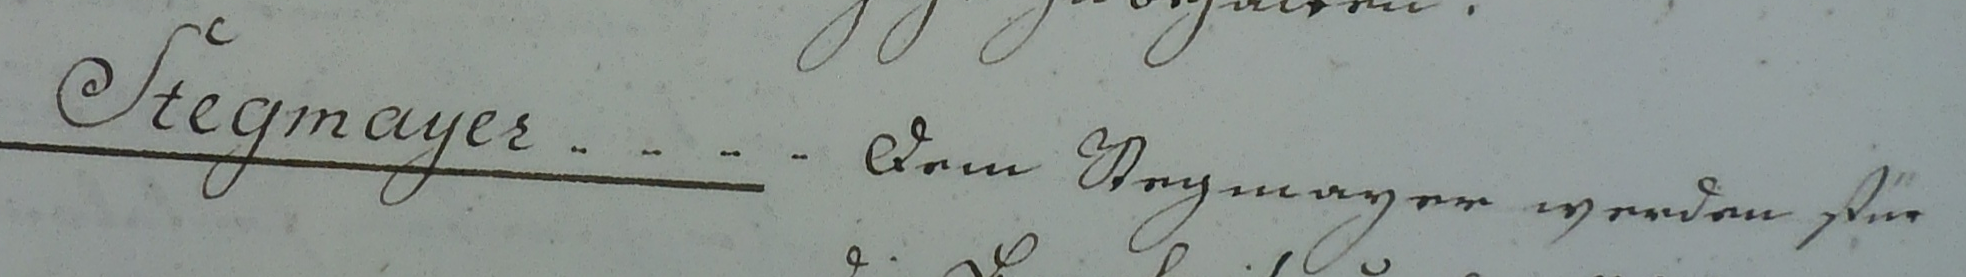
Stegmayer .. .. .. .. Dem Stegmayer werden für
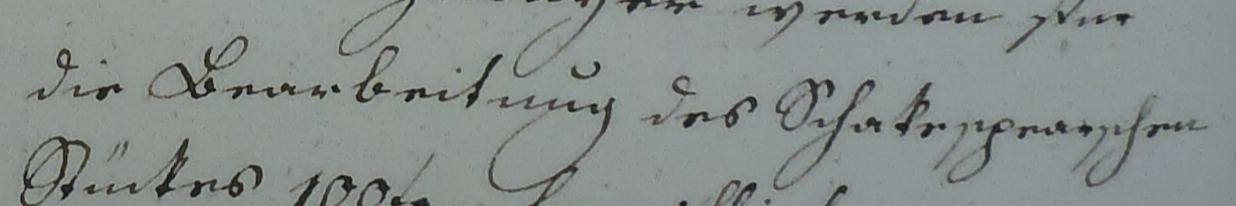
die Bearbeitung des Schakespearschen
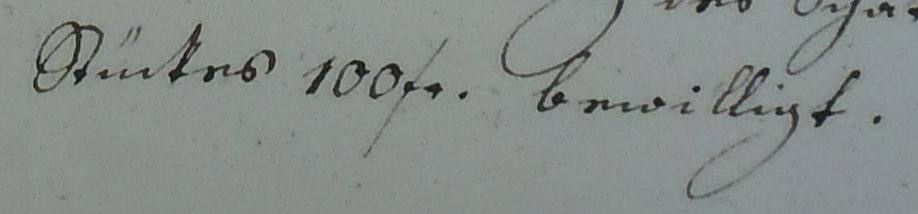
Stückes 100fr. bewilligt.
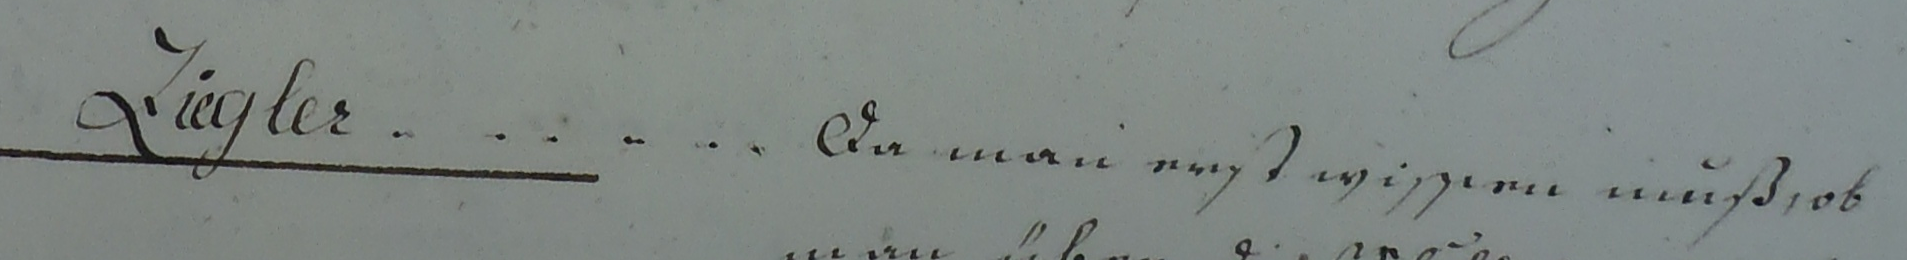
Ziegler .. . . .. . . Da man erst wissen muß, ob
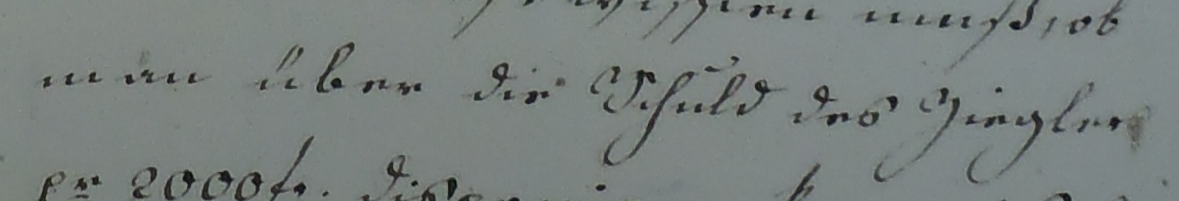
man über die Schuld des Ziegler
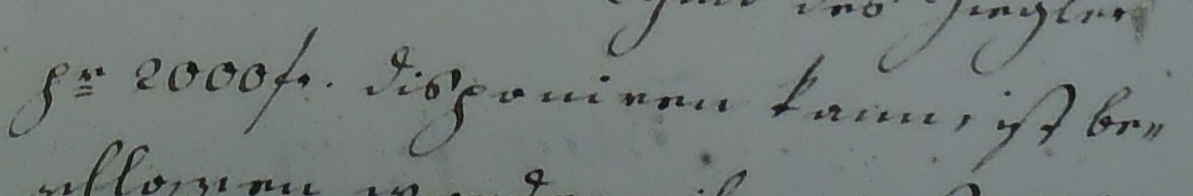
pr͇ 2000fr. disponiren kann, ist be¬
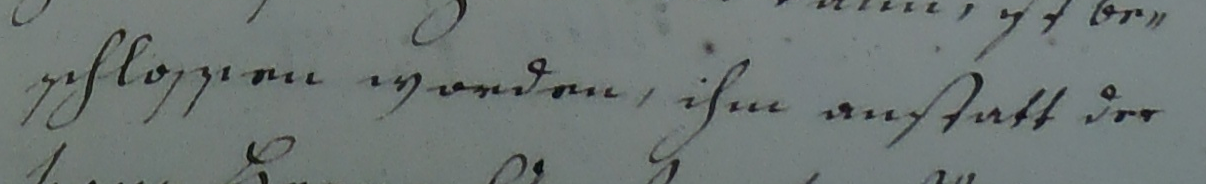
schlossen worden, ihm anstatt der
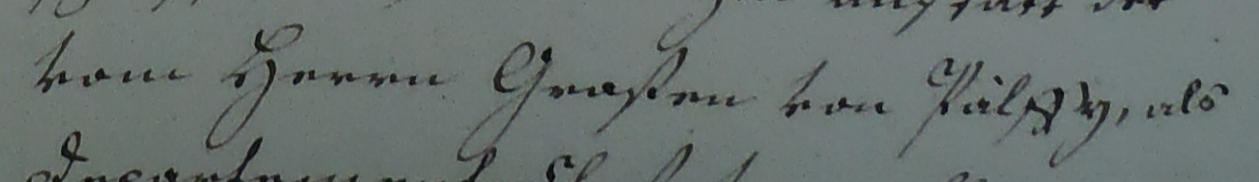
vom Herrn Grafen von Pàlffy, als
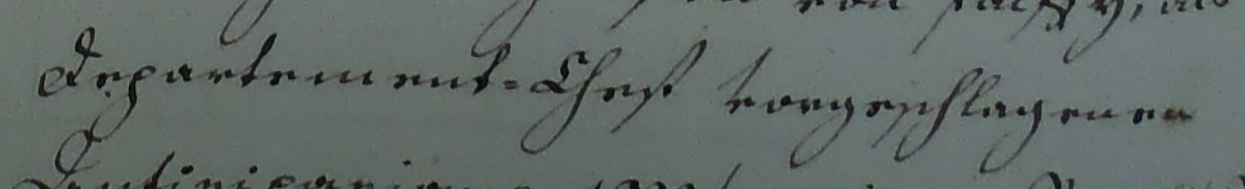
Departement=Chef vorgeschlagenen
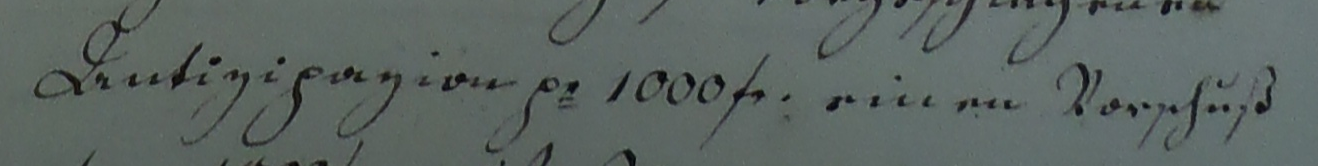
Antizipazion pr͇ 1000fr. einen Vorschuß
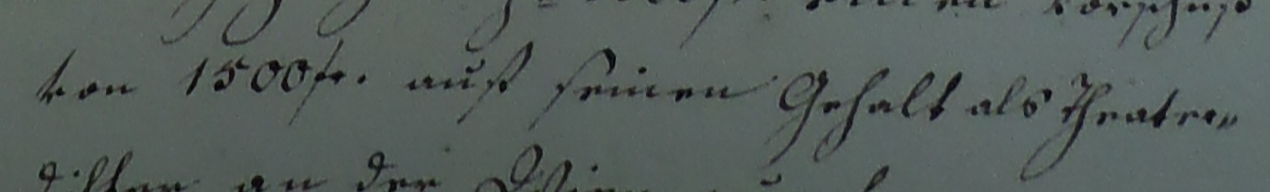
von 1500fr. auf seinen Gehalt als Teater¬
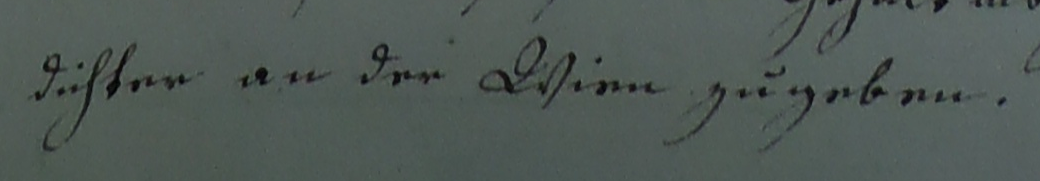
dichter an der Wien zugeben.
